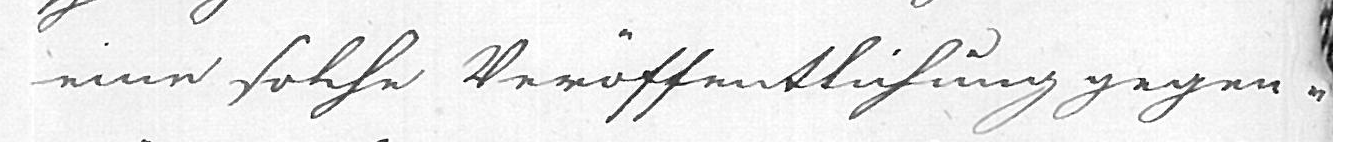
eine solche Veröffentlichung gegen-
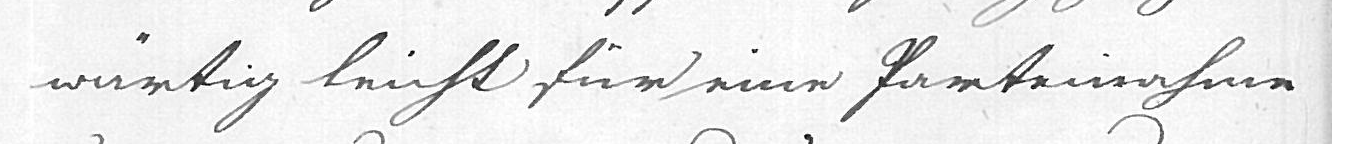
wärtig leicht für eine Parteinahme
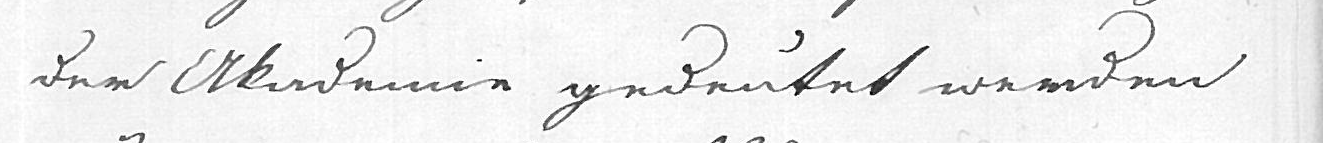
der Akademie gedeutet werden
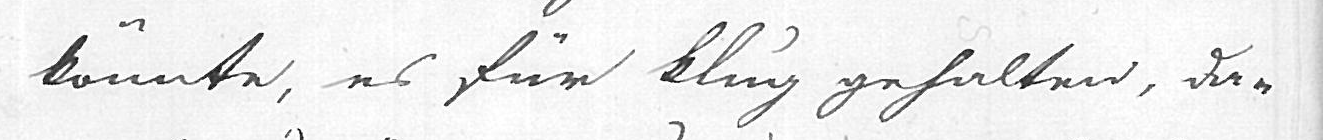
könnte, es für klug gehalten, da-
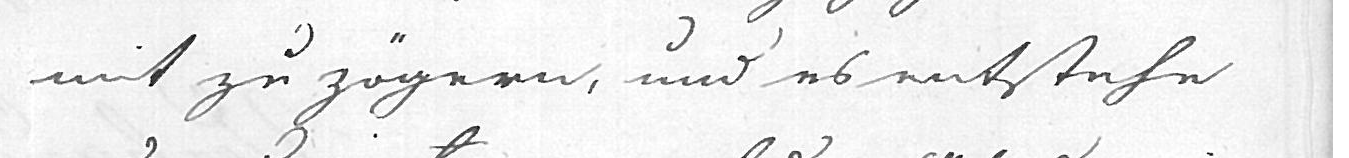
mit zu zögern, und es entstehe
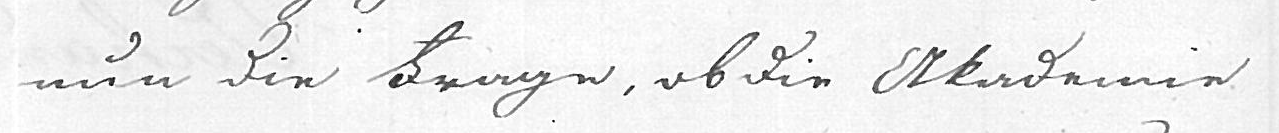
nun die Frage, ob die Akademie
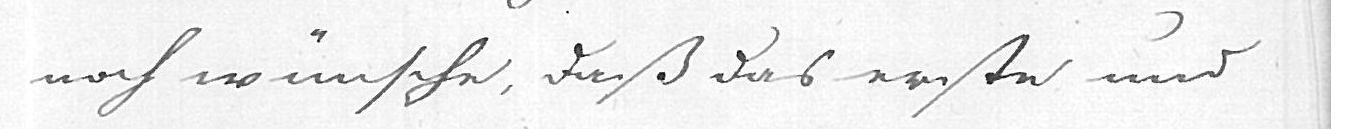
noch wünsche, daß das erste und
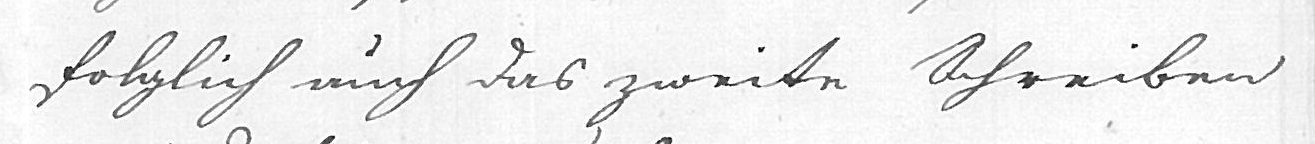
folglich auch das zweite Schreiben
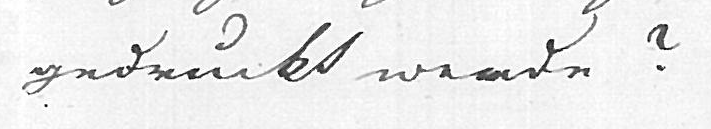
gedruckt werde?
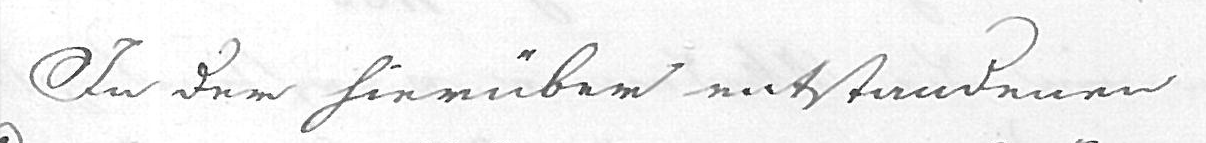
In der hierüber entstandenen
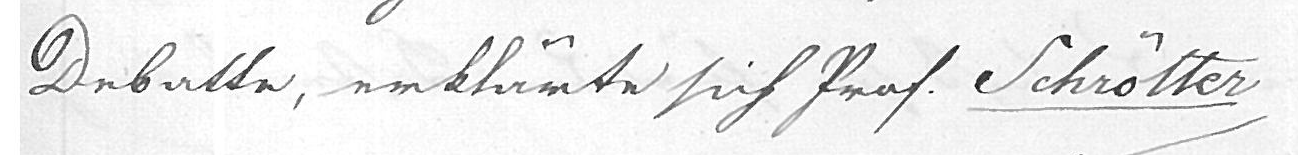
Debatte, erklärte sich Prof. Schrötter
